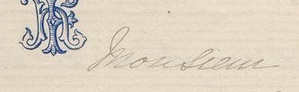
Monsieur
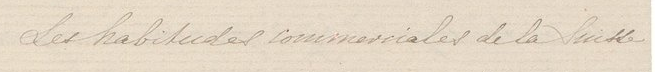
Les habitudes commerciales de la Suisse
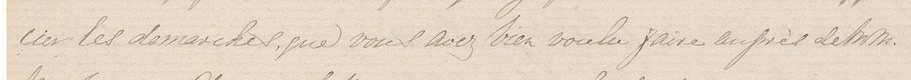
cier les demarches, que vous avez bien voulu faire auprès de MMs.
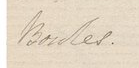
Bowles.
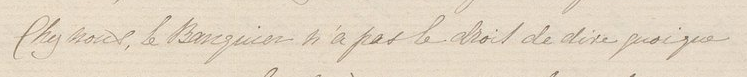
Chez nous, le Banquier n'a pas le droit de dire quoique
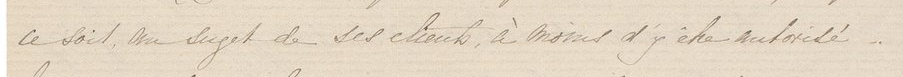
ce soit, au sujet de ses clients, à moins d'y être autorisé –.
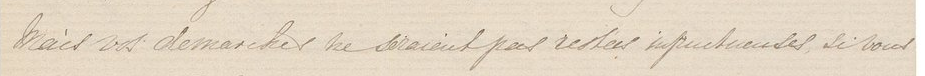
Mais vos demarches ne seraient pas restées infructueuses, si vous
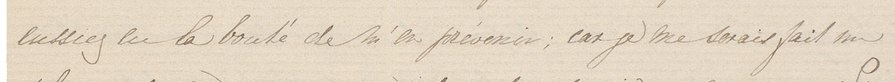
eussiez eu la bonté de m'en prévenir; car je me serais fait un
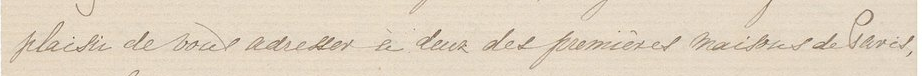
plaisir de vous adresser à deux des premières maisons de Paris,
